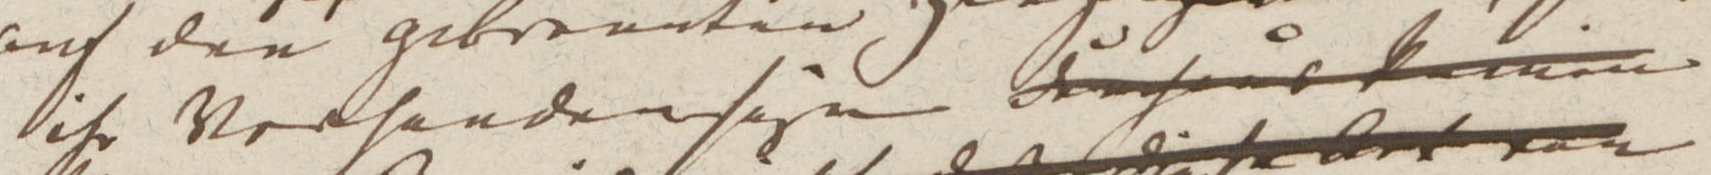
ihr Vorhandenseyn durchaus keinen
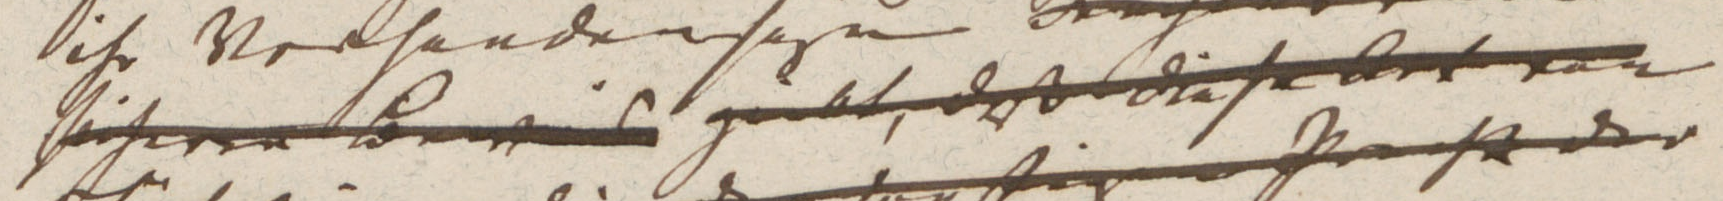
sicheren Beweis giebt, dass diese Art von
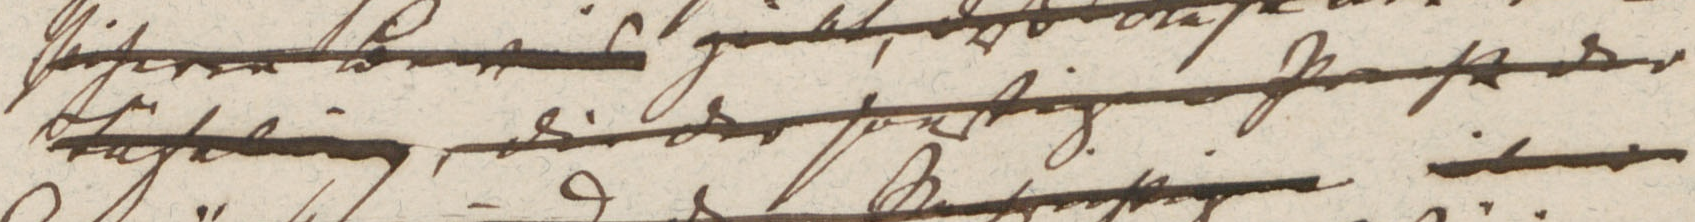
Täfelung , die der sonstigen Pracht der
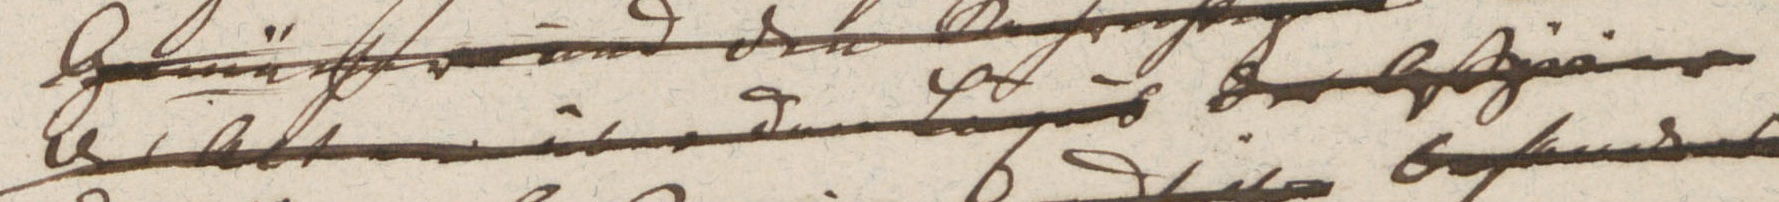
der Alten über den Luxus der Assyrier
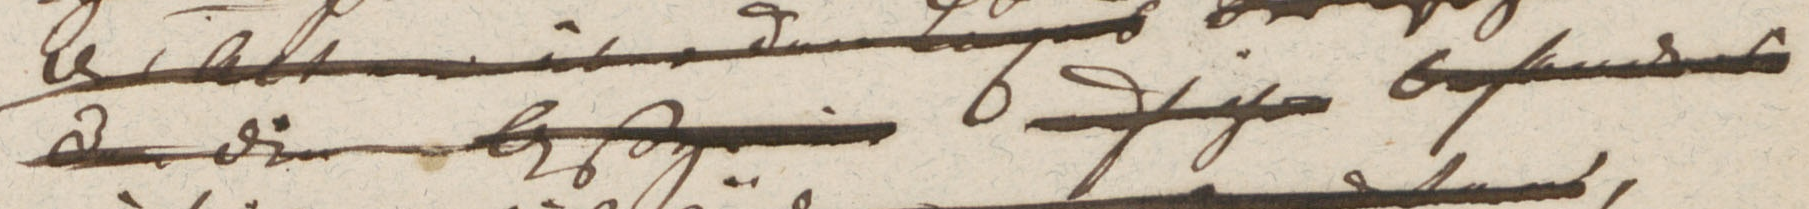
den die Assyrier auf ihre besonders
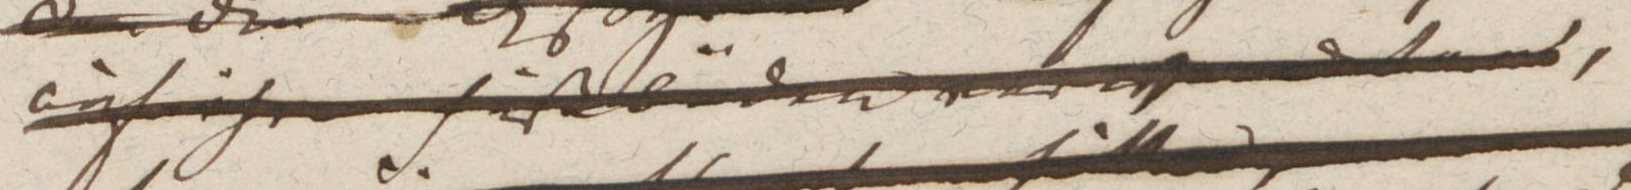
auf ihre Fussböden verwendeten,
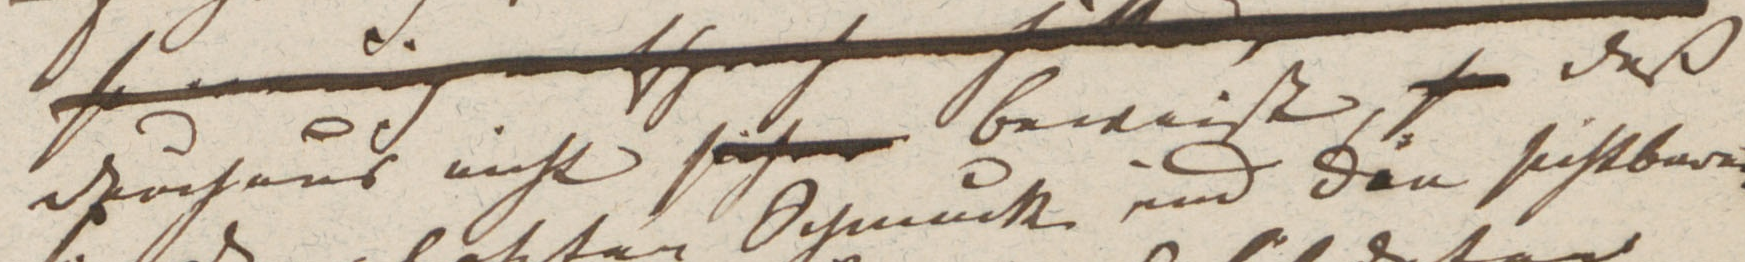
durchaus nicht sicher beweist, so dass
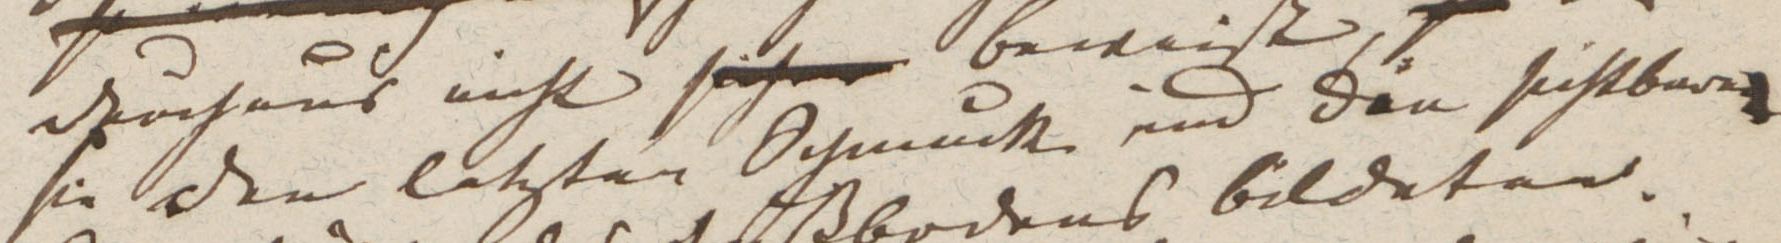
sie den letzten Schmuck und deie sichtbaren
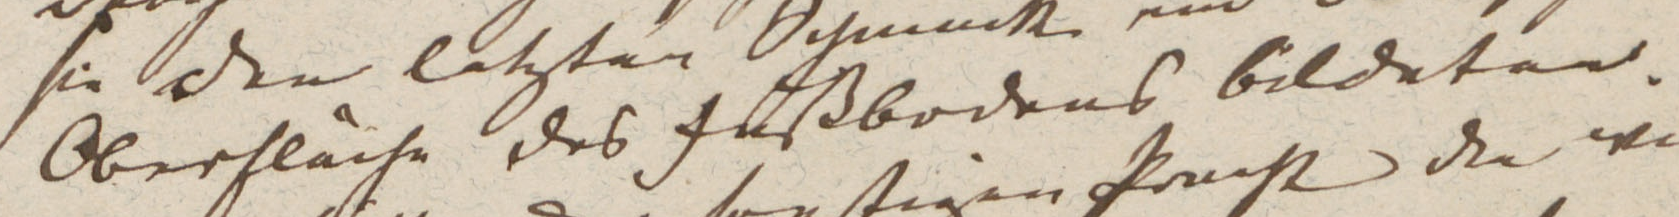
Oberfläche des Fussbodens bildeten.
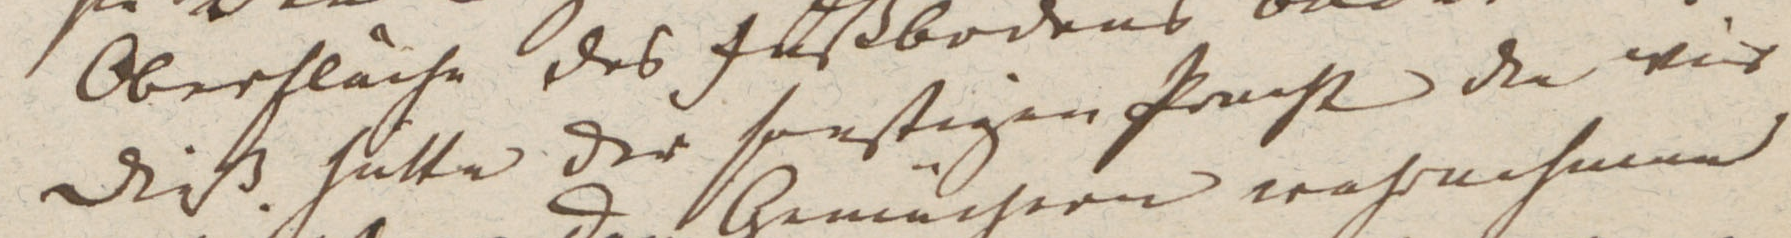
Diess hätte der sonstigen Pracht die wir
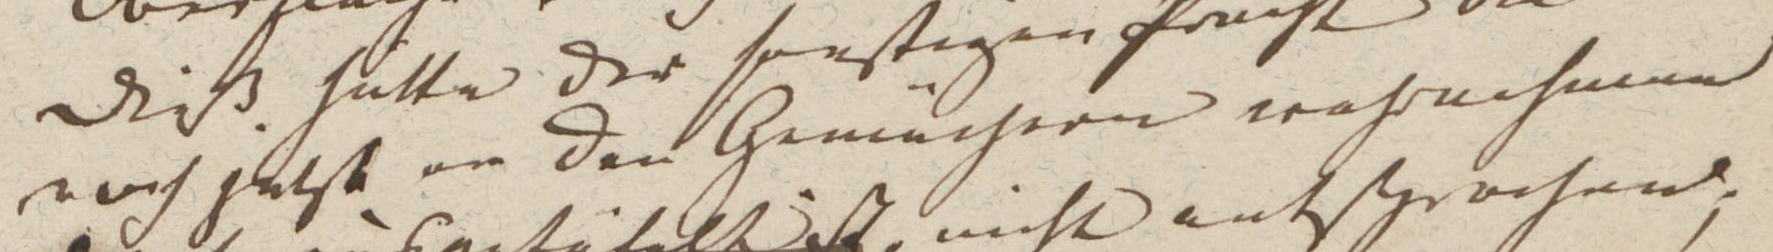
noch jetzt an den Gemächern wahrnehmen
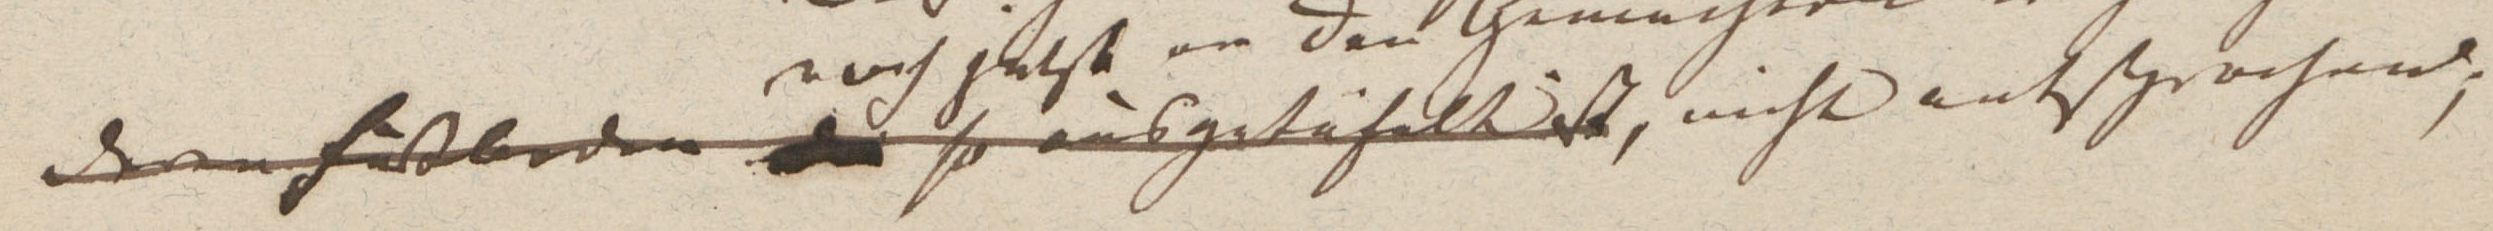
deren Fussboden ausgetäfelt ist, nicht entsprechend;
